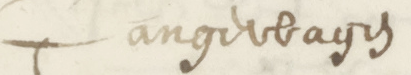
Langewagen
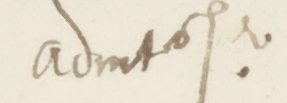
admtshr.
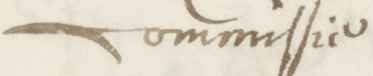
commissie
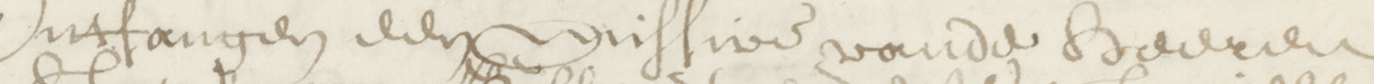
Ontfangen een missive vande Heeren
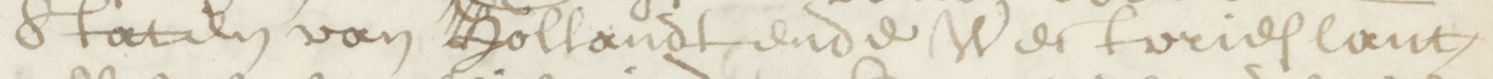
Staten van Hollandt, ende Westvrieslant,
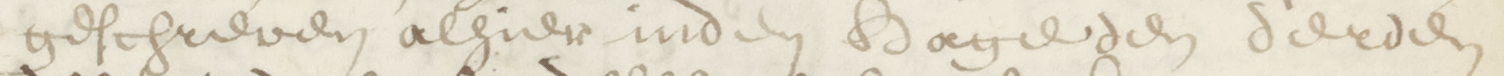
geschreven alhier inden Hage den derden
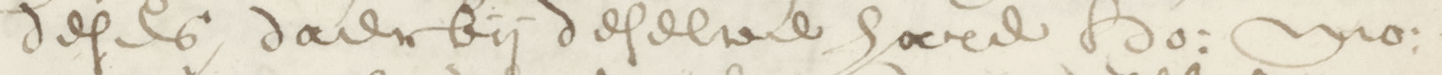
deses, daerbij deselve hare Ho:Mo:
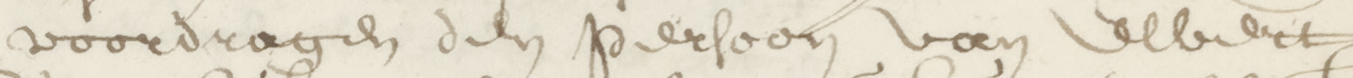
voordragen den persoon van Elbert
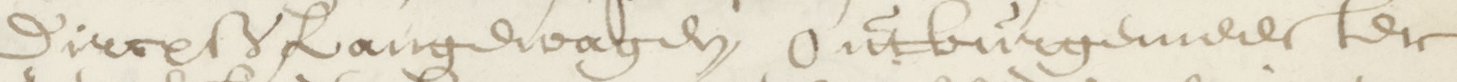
Dircxsz Langewagen, outburgemeester
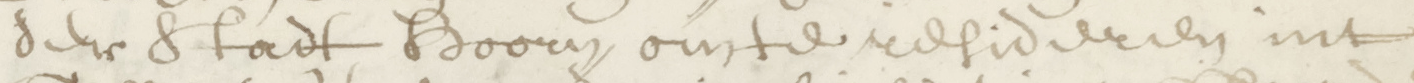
der Stadt Hoorn, om te resideren int
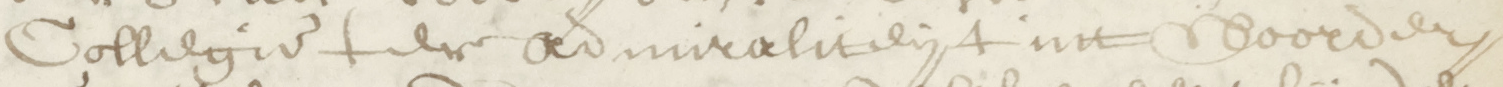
Collegie ter admiraliteijt int Noorder,,
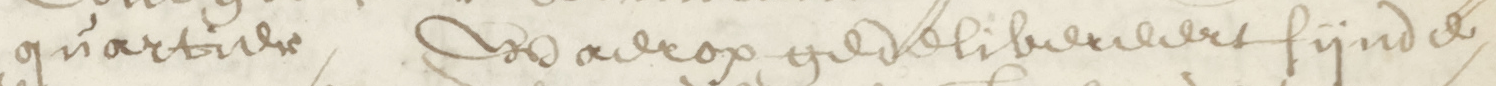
quartier. Waerop gedelibereert sijnde,
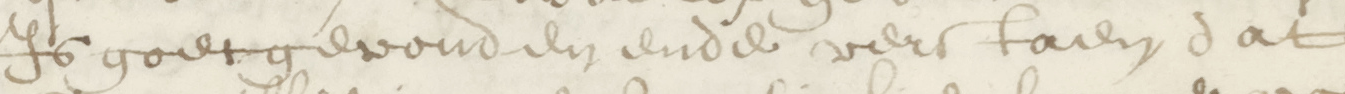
Is goetgevonden ende verstaen, dat
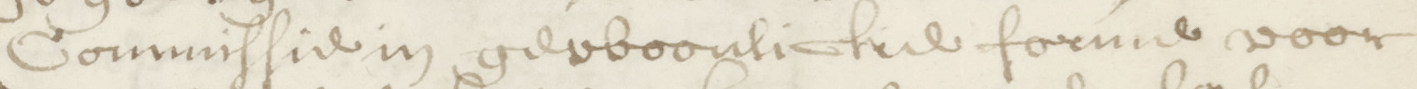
Commissie in gewoonlicke forme voor
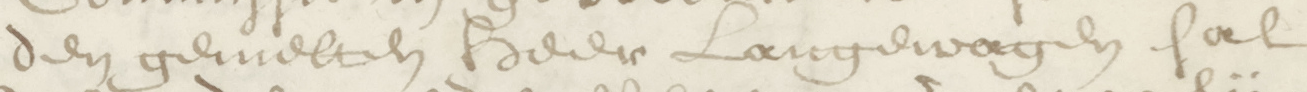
den gemelten Heer Langewagen sal
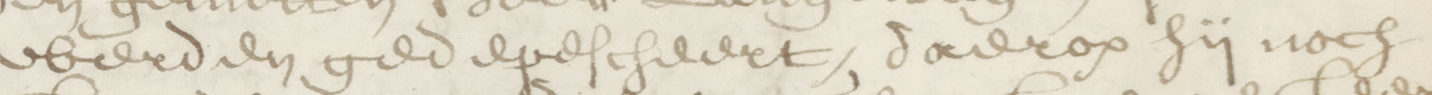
werden gedepescheert, daerop hij noch
